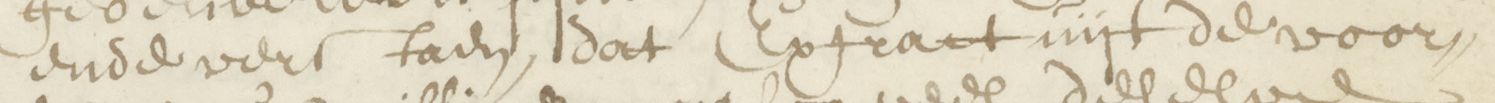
ende verstaen, dat Extract uijt de voor„
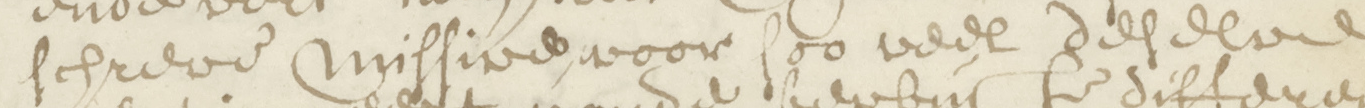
schreve missive voor soo veel deselve
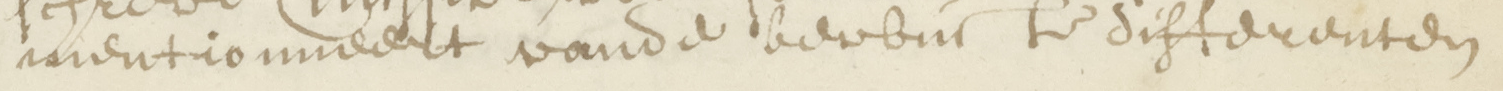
mentionneert vande bewuste differenten
